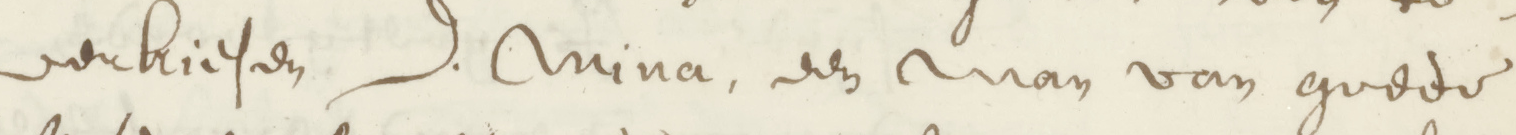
verkiesen D. Mina, een man van goede
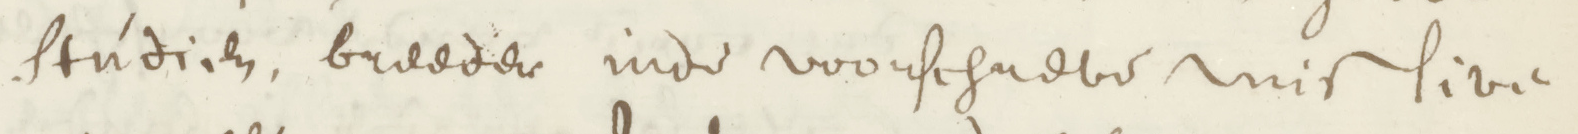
studien, breeder inde voorschreve missive
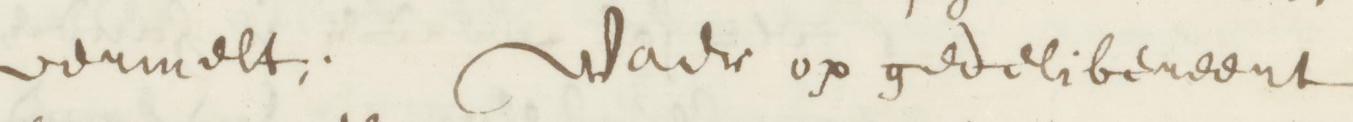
vermelt; Waer op gedelibereert
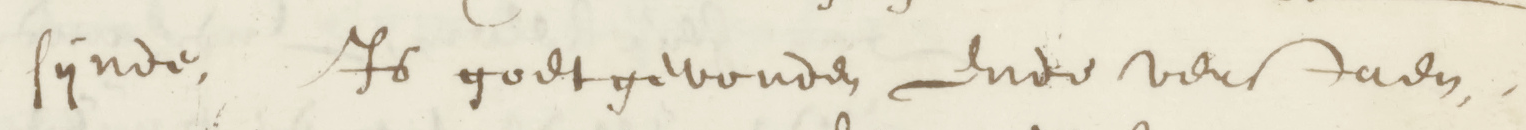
sijnde, Is goetgevonden ende verstaen
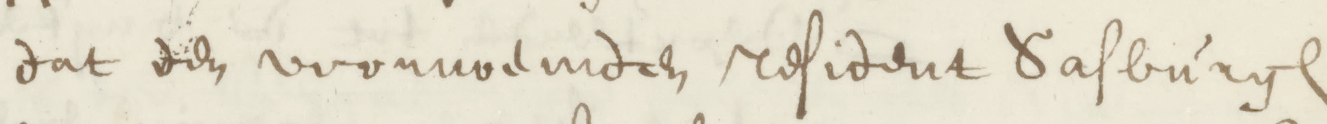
dat den voornoemden resident Sasburgh
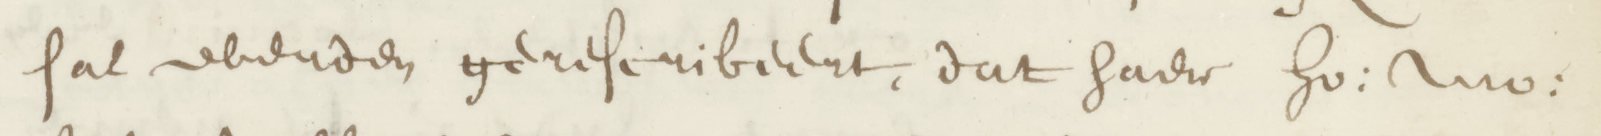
sal werden gerescribeert, dat haer ho:mo:
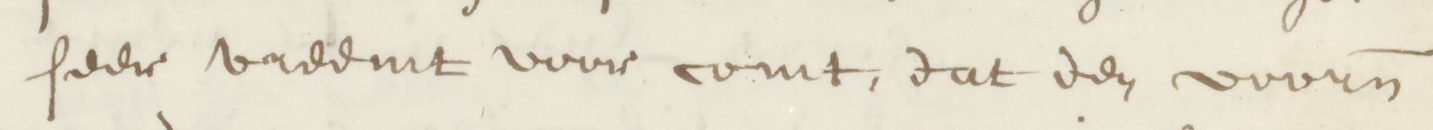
seer vreemt voor comt, dat den voorn
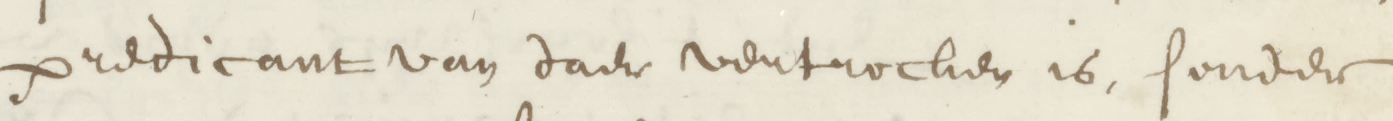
predicant van daer vertrocken is, sonder
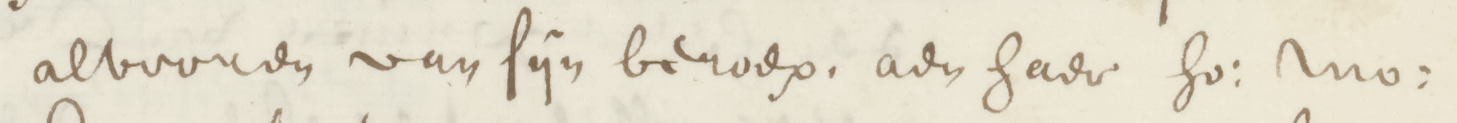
alvooren van sijn beroep aen haer ho:mo:
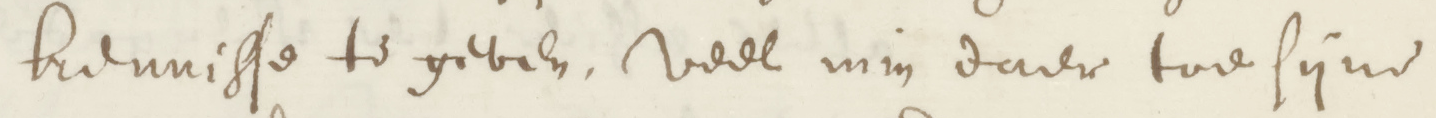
kennisse te geven, veel min daer toe sijne
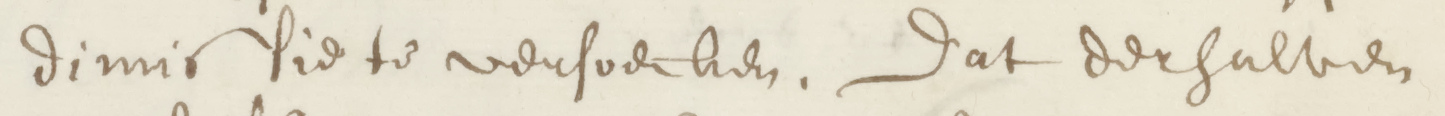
dimissie te versoecken. Dat derhalven
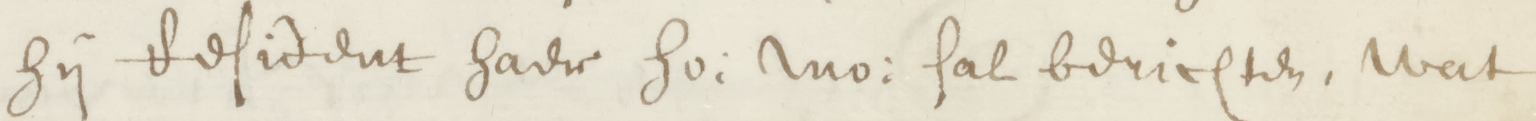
hij resident haer ho:mo: sal berichten, wat
